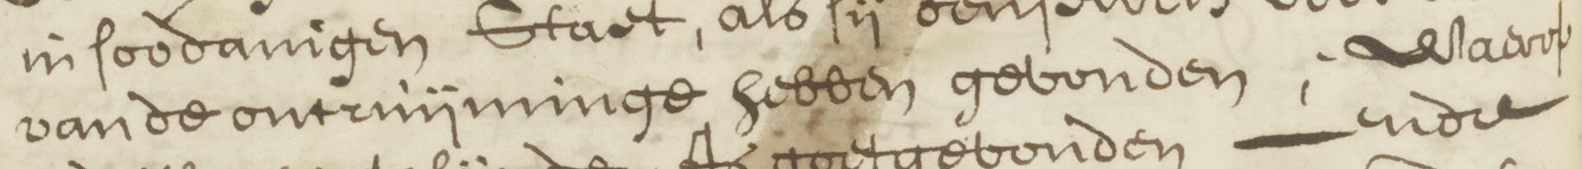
van de ontruijminge hebben gevonden; Waerop
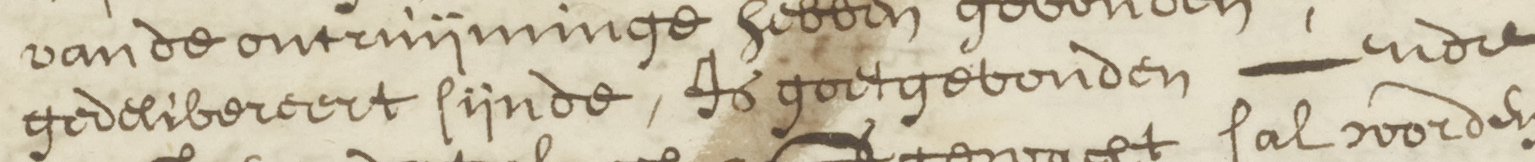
gedelibereert sijnde, Is goetgevonden ende
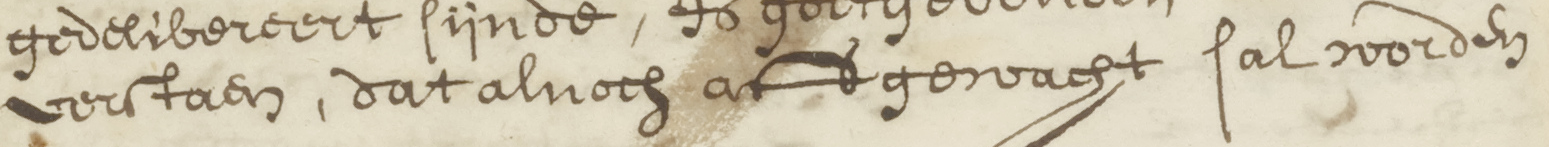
verstaen, dat alnoch affgewacht sal worden
